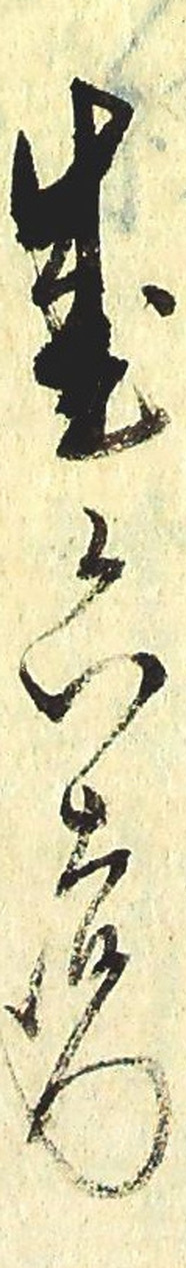丑盛六右衛門
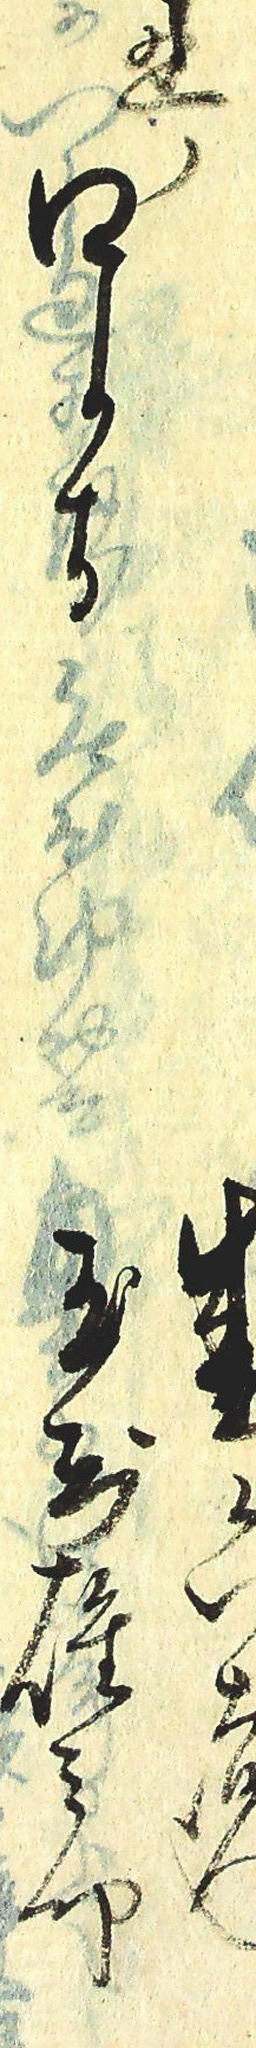四月十日武知雄之助

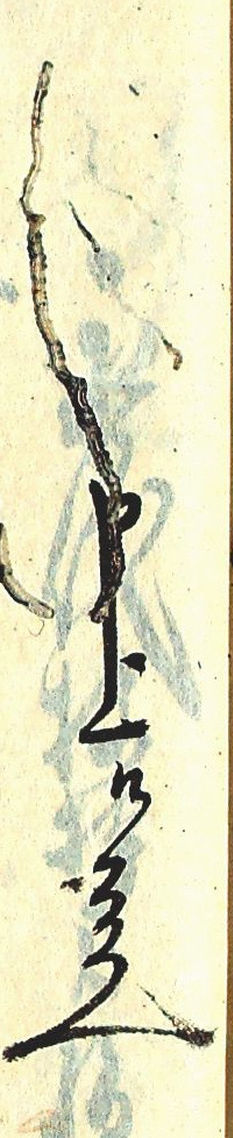申上る覚
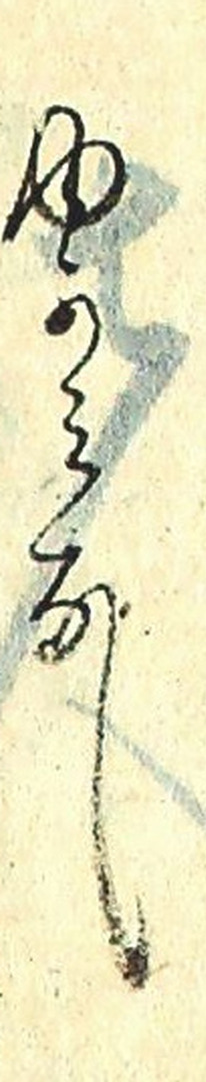ゆかみなし
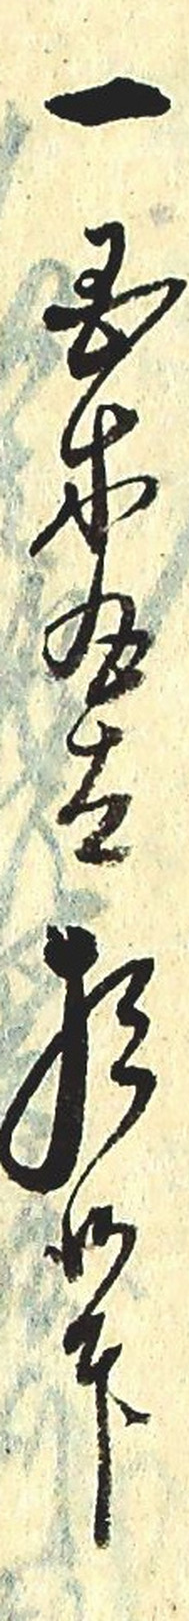一白木丸太拾弍本
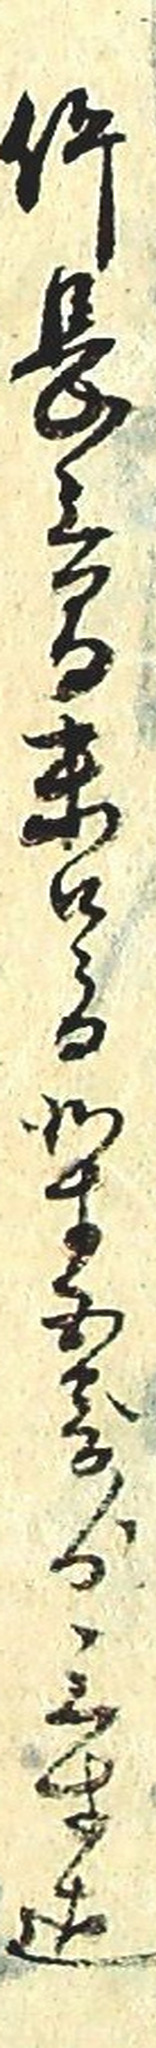但し長三間末口にて弐寸五歩ゟ三寸迄
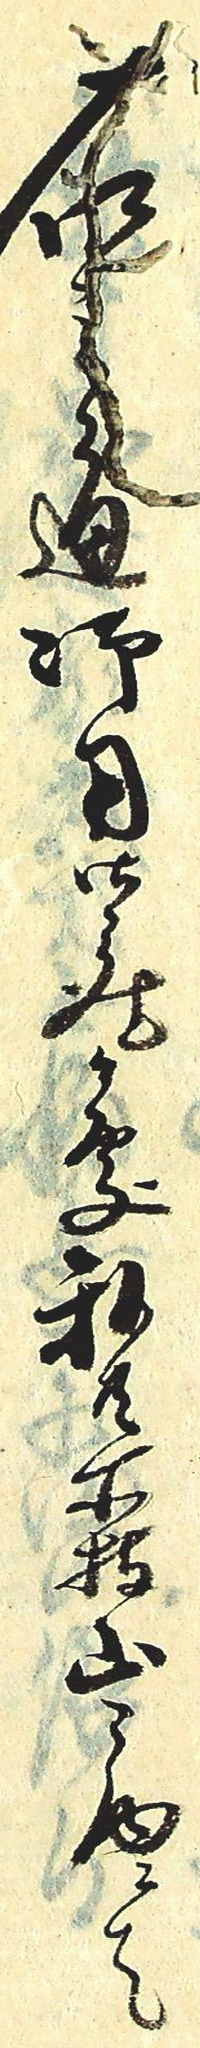右之通御用御座候処私共所持山之内には
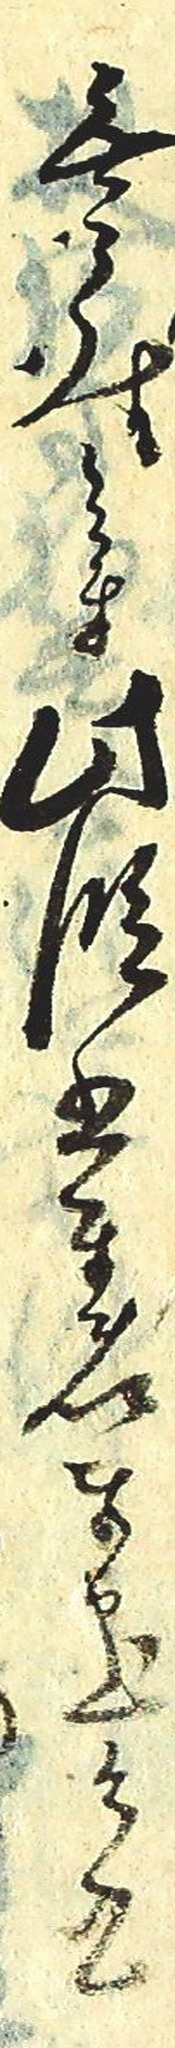無御座候に付此段書付を以奉申上候以上
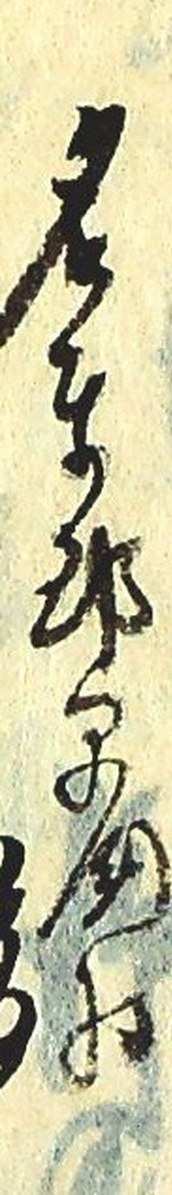名東郡早淵村
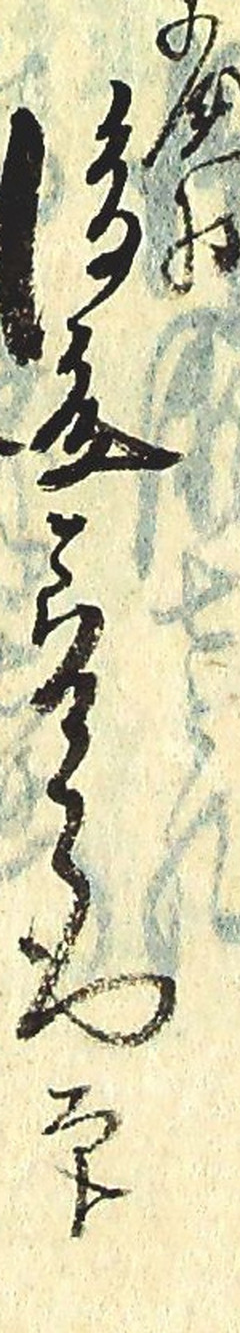後藤善右衛門印
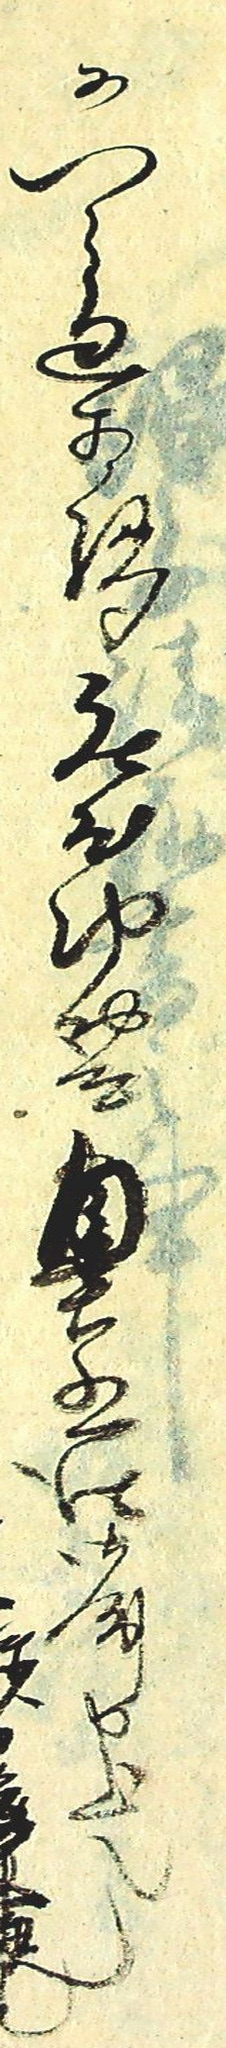右之通相認め庄屋仲助殿奥書仕御応申上候

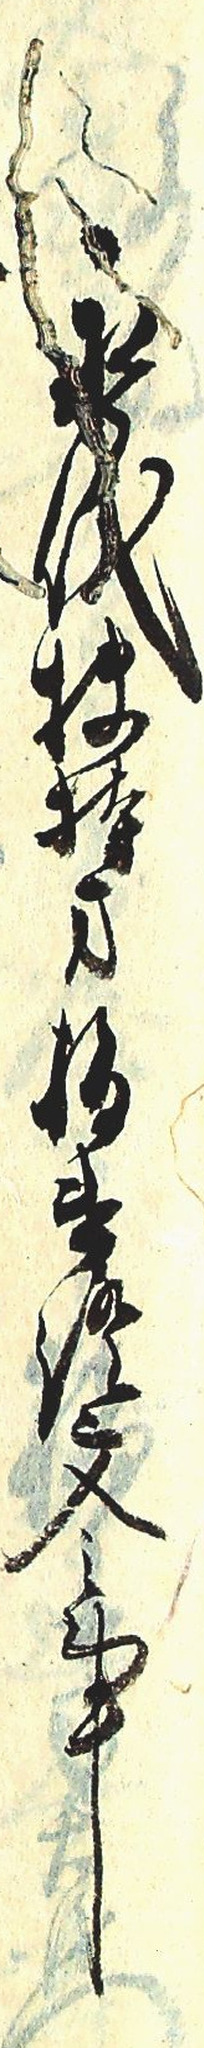永代扶持方指遣証文之事
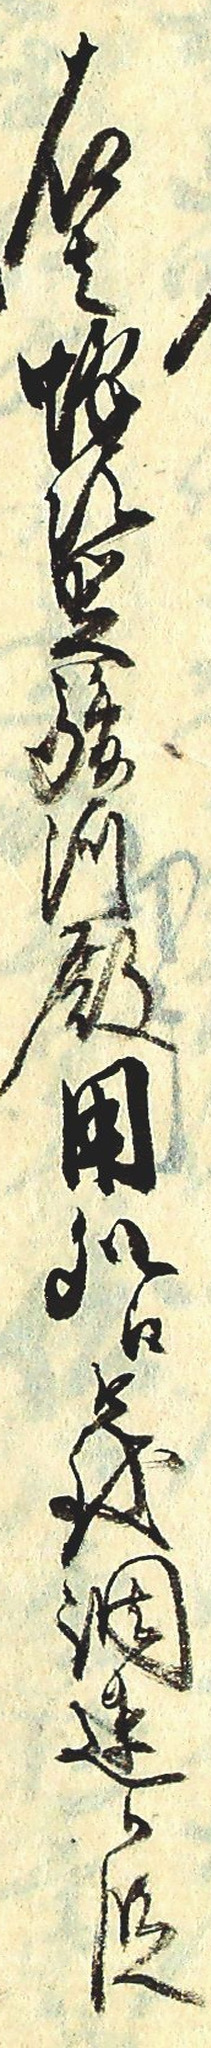右は蜂須賀駿河殿用処え被致調達候段
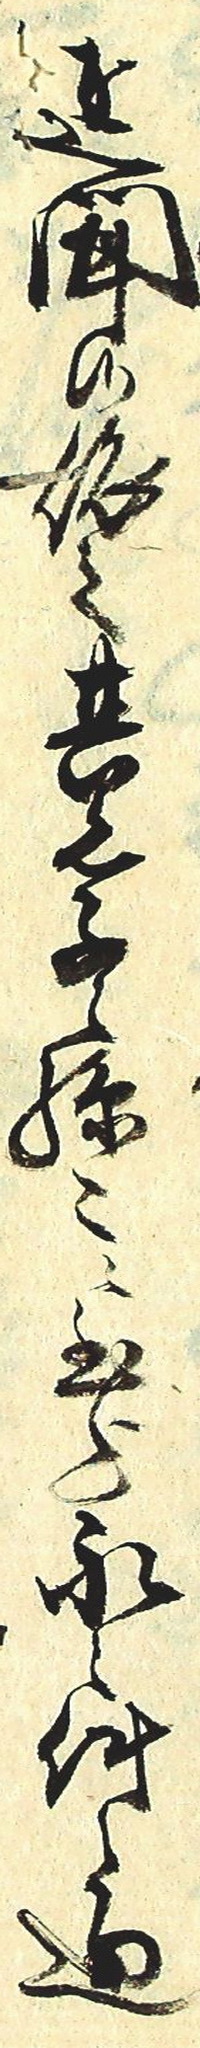達聞候依之其元子々孫々に至迄永々件之通
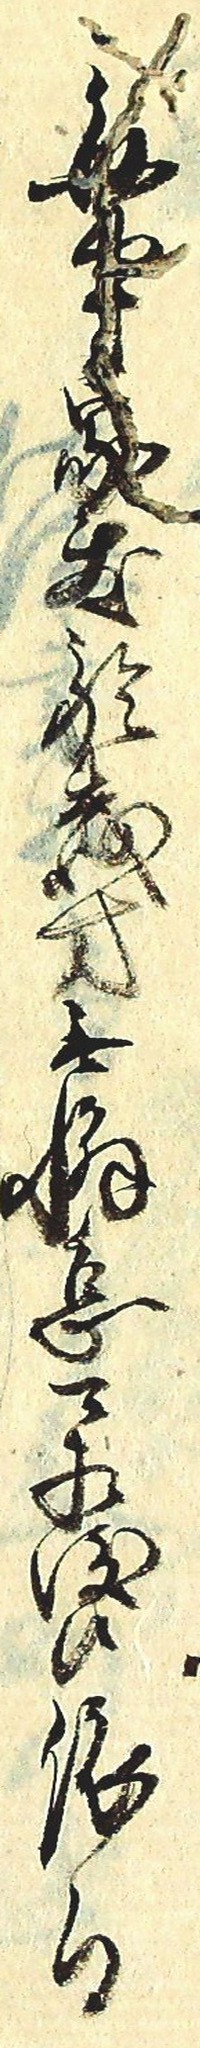毎事家敷於蔵方無懈怠可相渡候依て
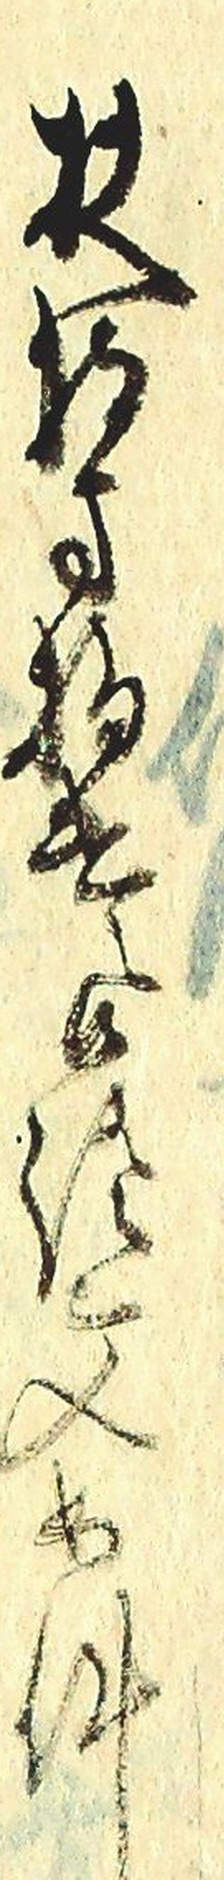扶持方指遣し候証文如件
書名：諸御願書控(弐番）
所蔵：鳴門教育大学 Naruto University of Education
